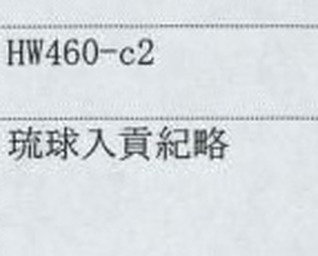琉球入貢紀略完
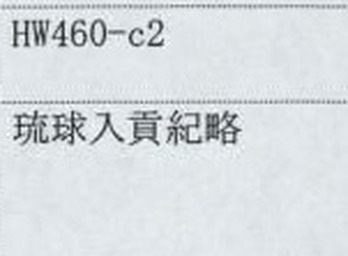琉球入貢紀略完
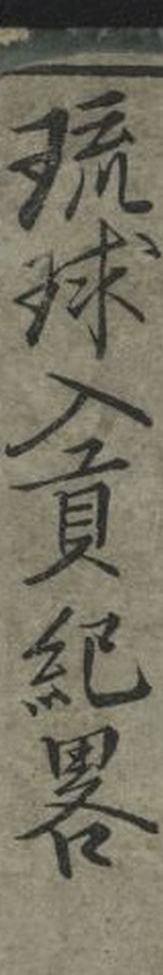琉球入貢紀略完

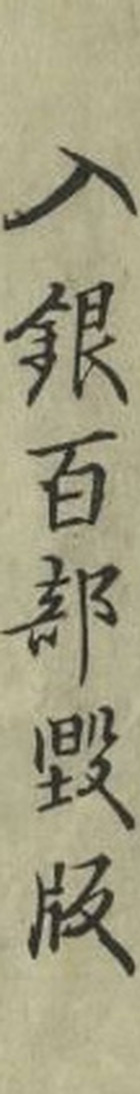入銀百部毀版
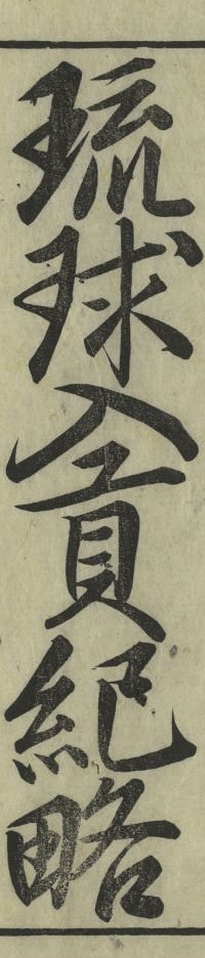琉球入貢紀略
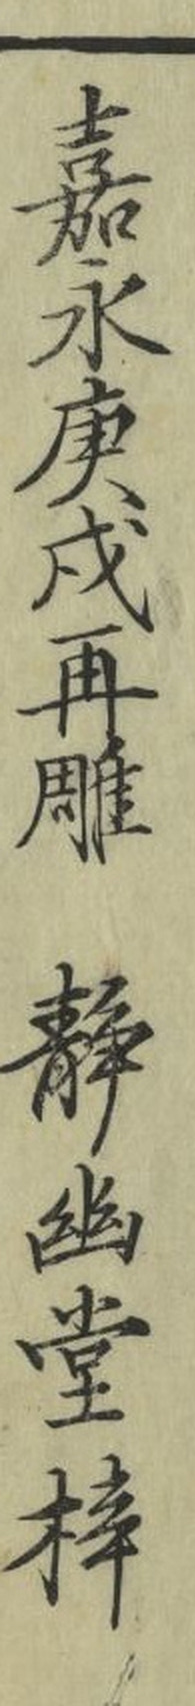嘉永庚戌再雕静幽堂梓
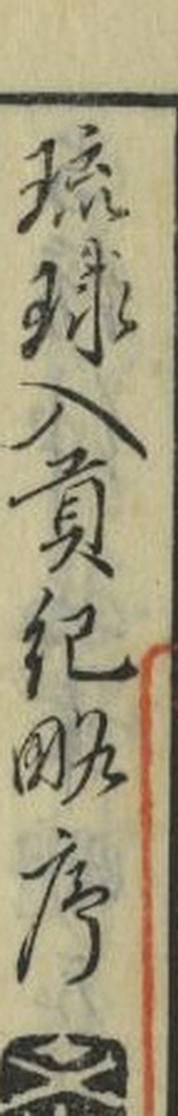琉球入貢紀略序
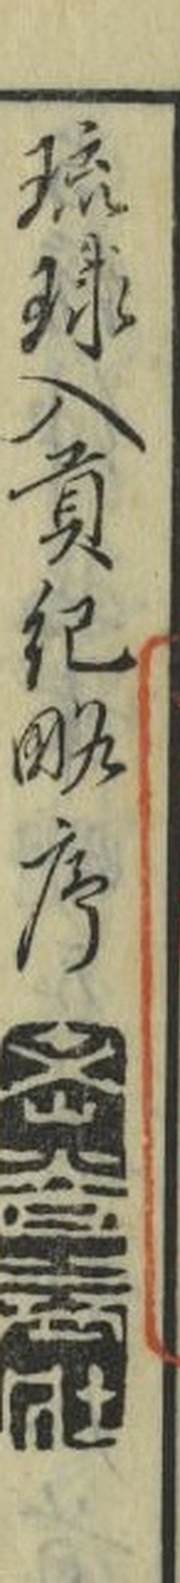琉球入貢紀略序
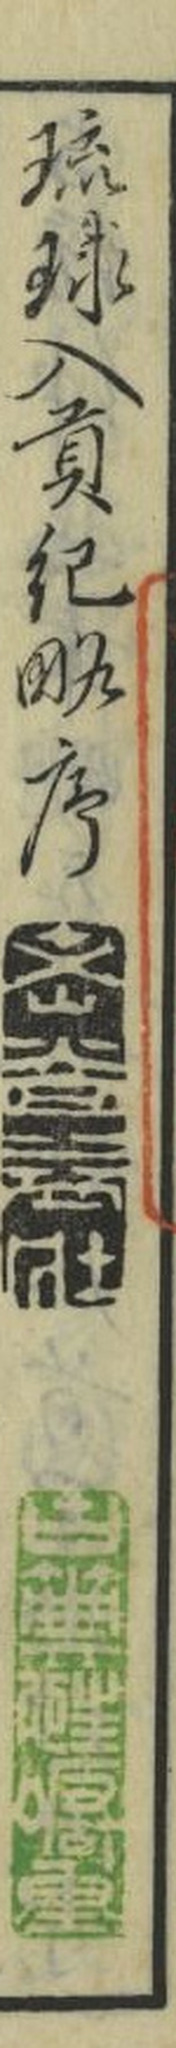琉球入貢紀略序
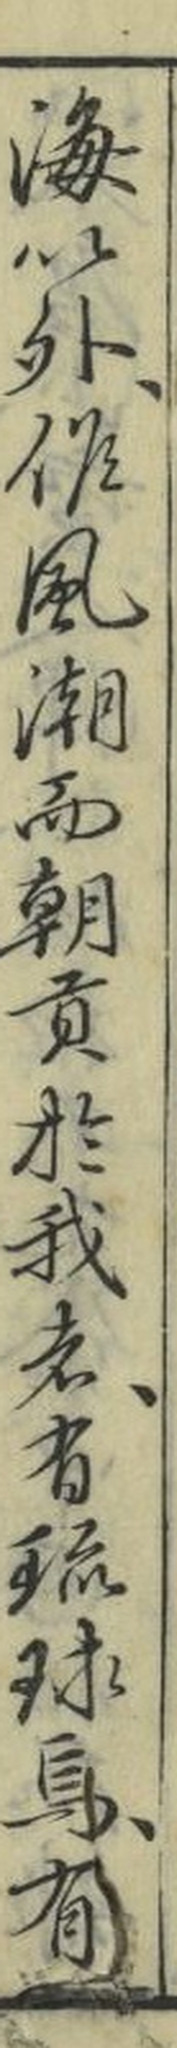海以外、作風潮而朝貢於我者、有琉球焉、有
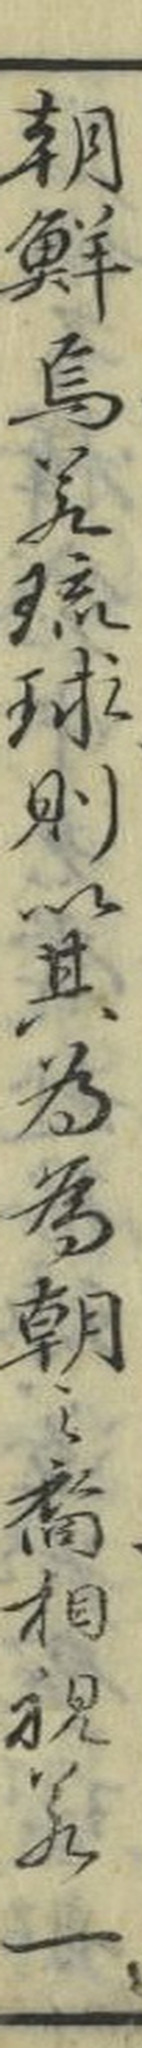朝鮮焉、若琉球、則以其為為朝之裔、相視若一
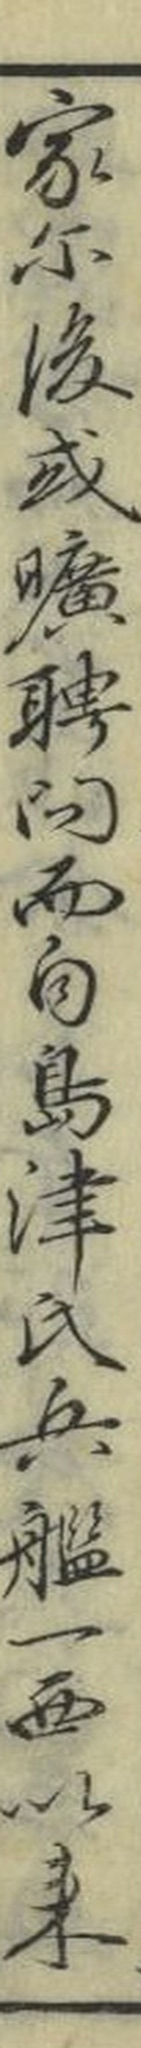家、尓後或曠聘問、而自島津氏兵艦一西以来、
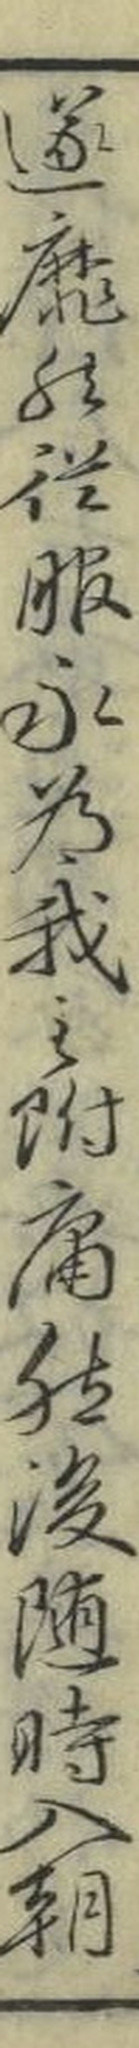遂靡然従服、永為我之附庸、然後随時入朝、
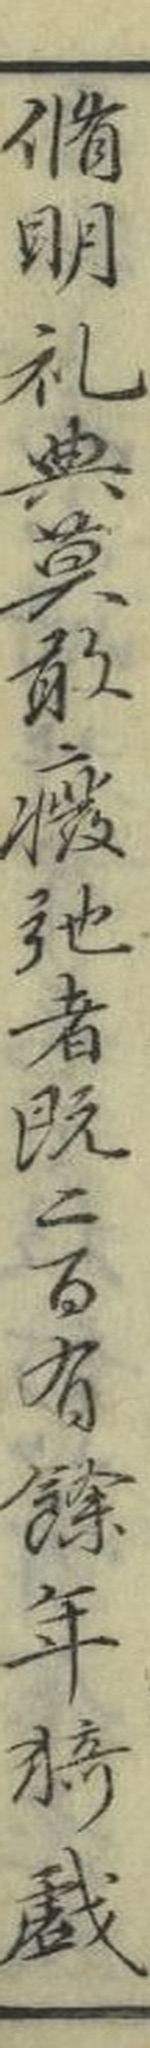脩明礼典、莫敢癈弛者、既二百有余年、猗戯
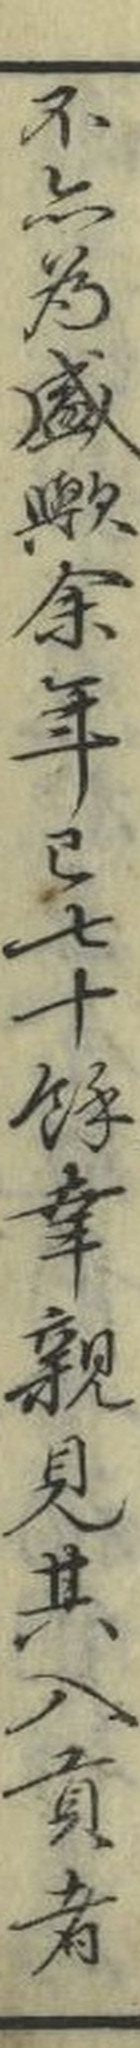不亦為盛歟、余年已七十余、幸親見其入貢者
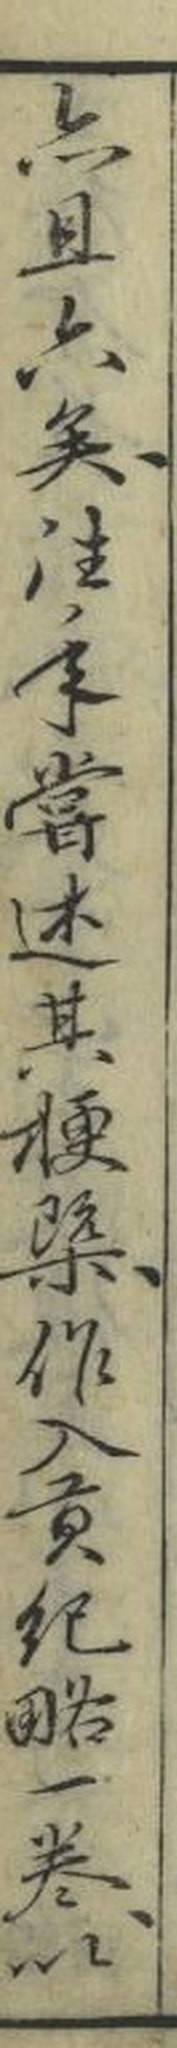亦且亦矣、往年嘗述其梗概、作入貢紀略一巻、以
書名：琉球入貢紀略
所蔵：University of the Ryukyus Library
